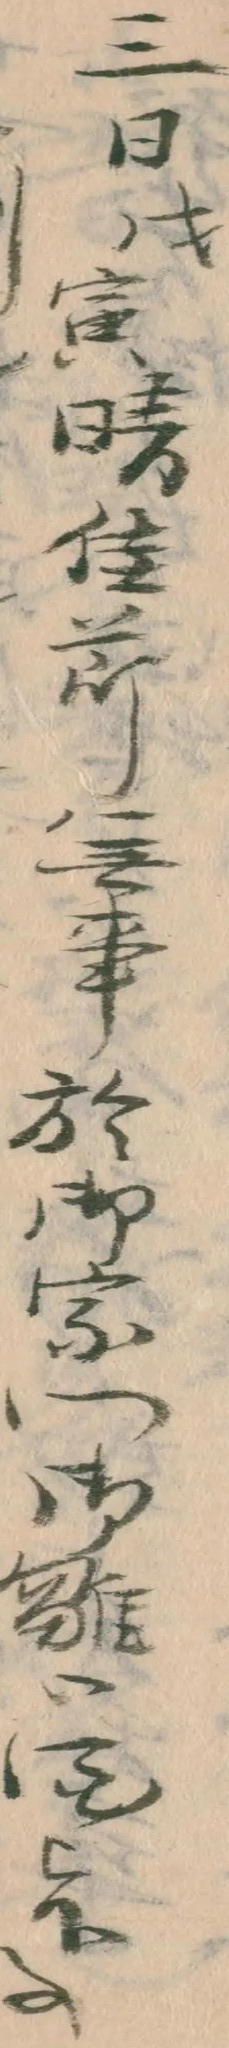三日戊寅晴佳節無事於御家門御雛御酒被下也
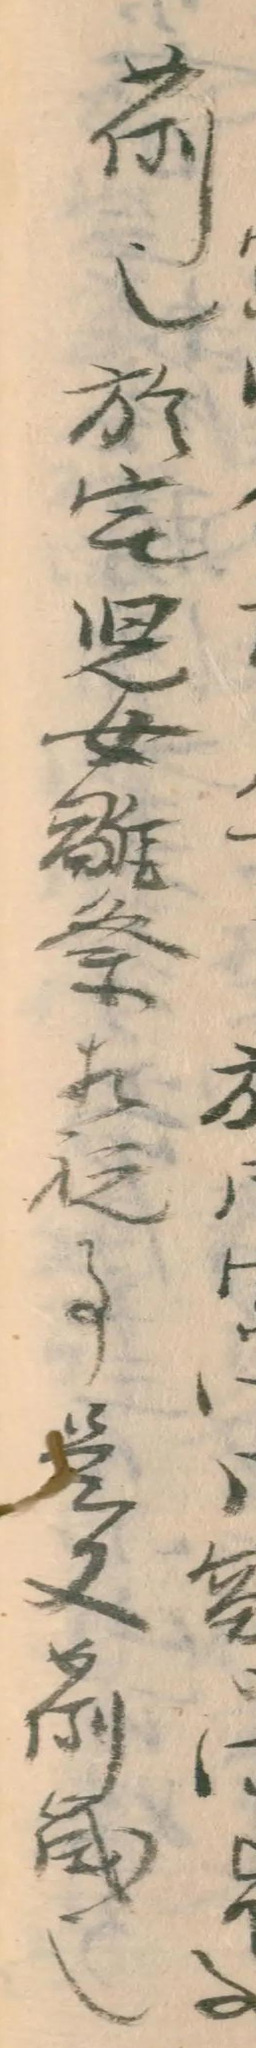如例也於宅児女雛祭相祝事是又例歳也
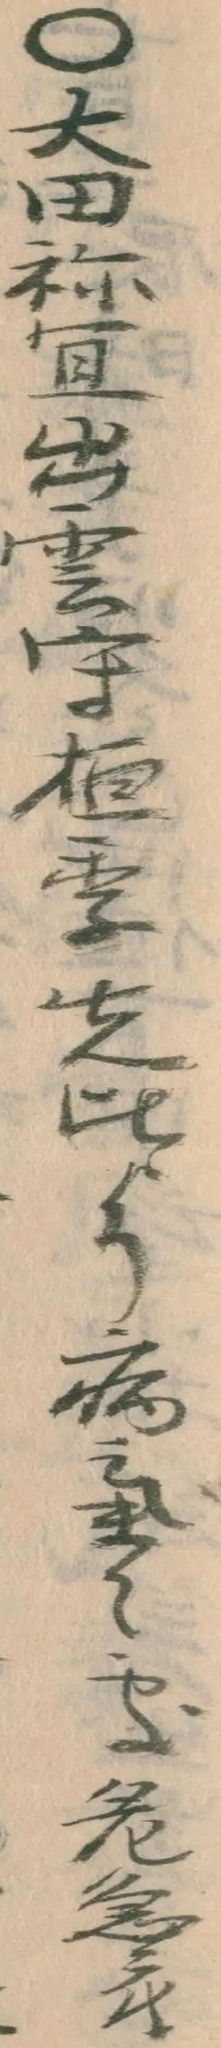○大田弥宜出雲守桓季先比より病気候處危急ニ付
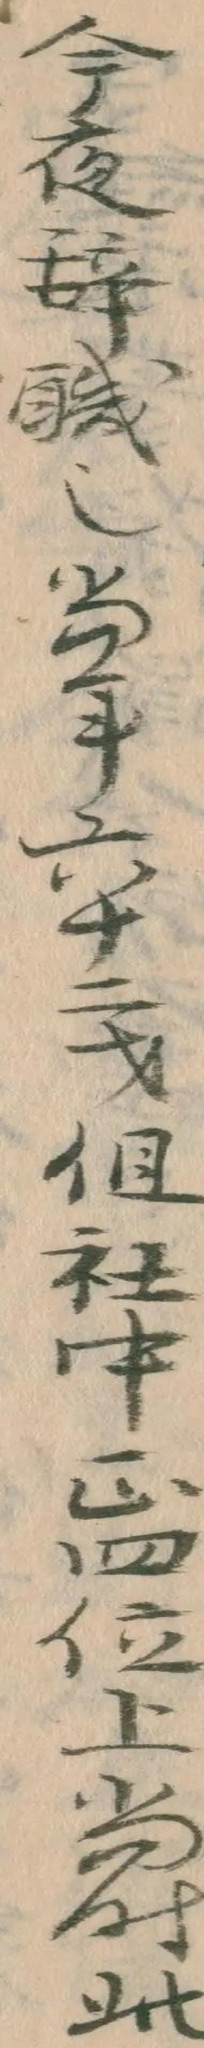今夜辞職也當年六十二才但社中正四位上當時此
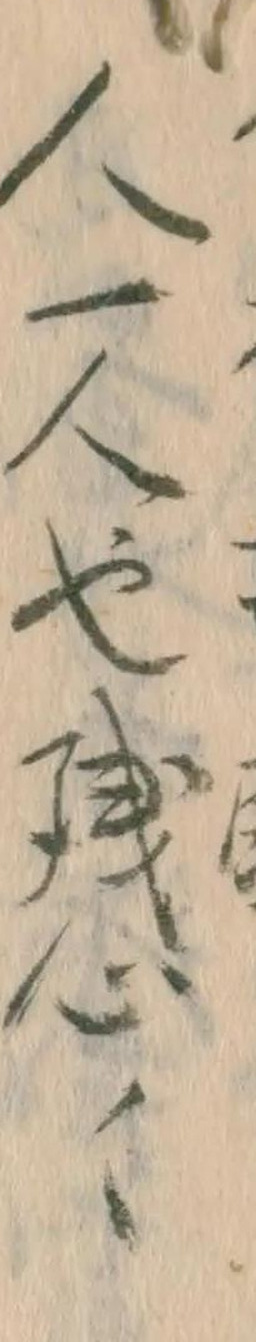人一人也残心〳〵
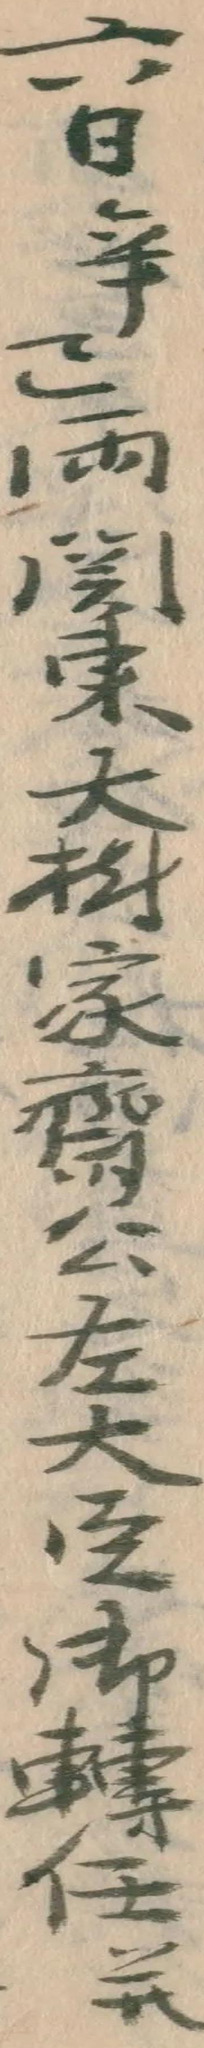六日辛巳両関東大樹家齋公左大臣御轉任幷
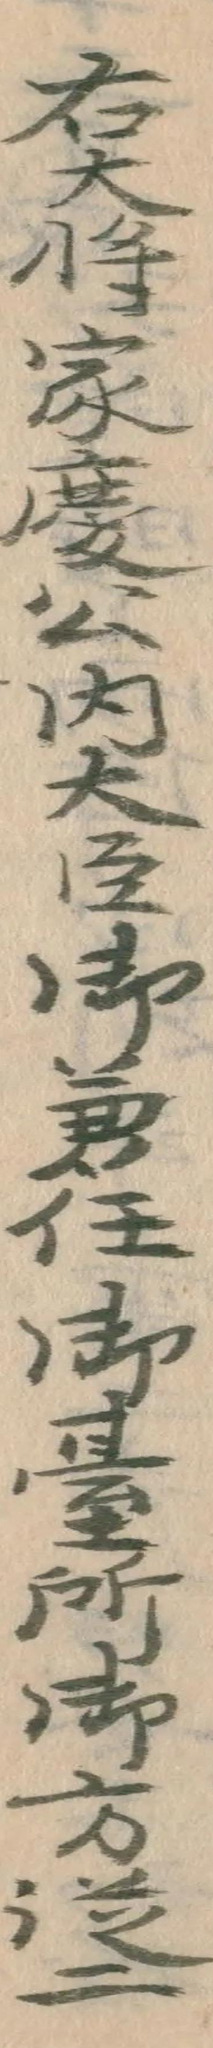右大将家慶公内大臣御兼任御䑓所御方従二
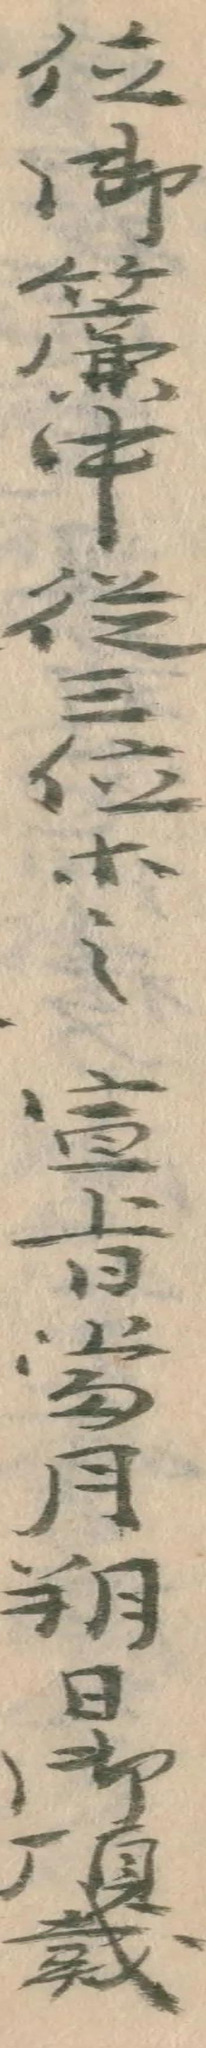位御簾中従三位等之宣旨當月朔日御頂戴
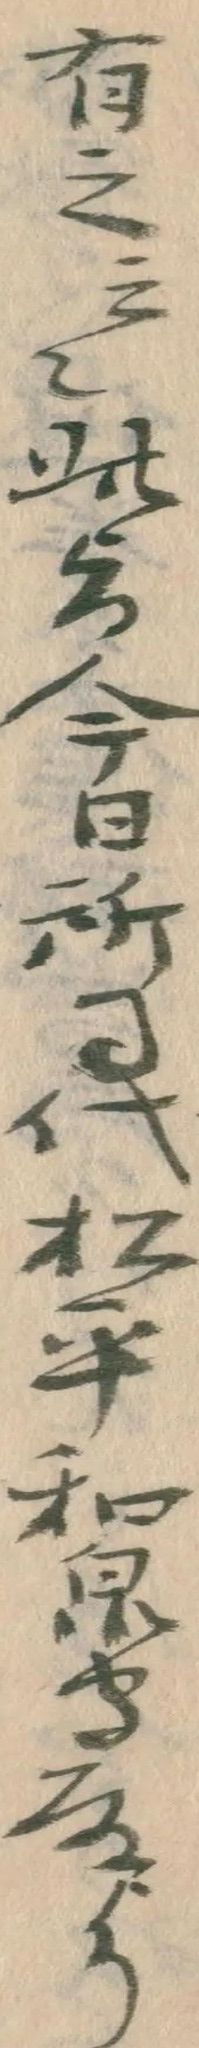有之云〻此旨今日所司代松平和泉守殿より
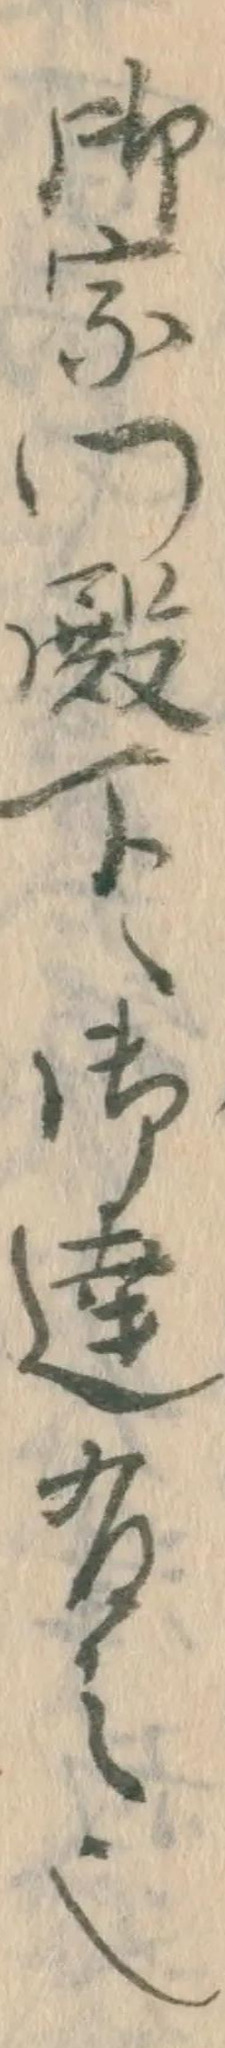御家門殿下へ御達有之也
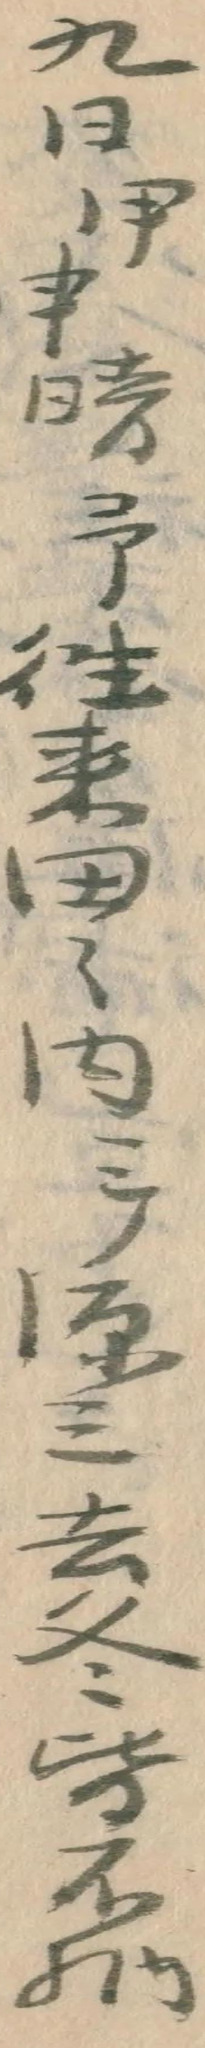九日甲申晴予往来田々内三ノ源三去冬皆不納
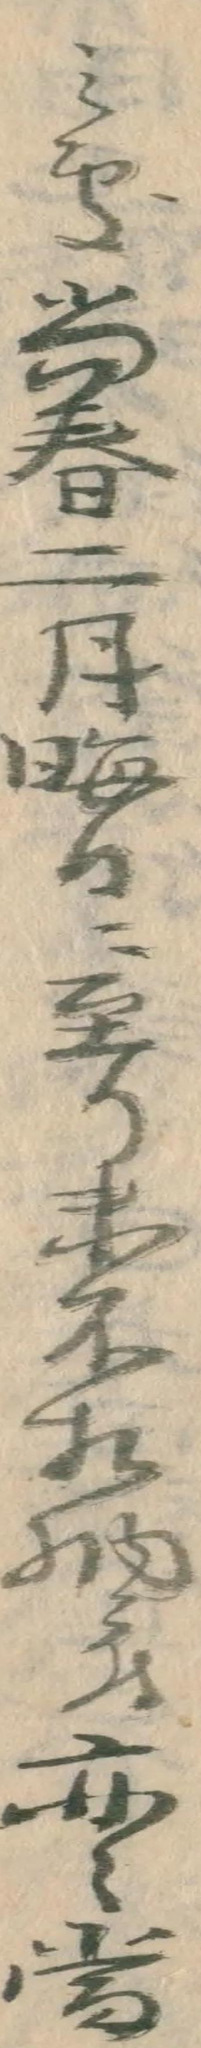之處當春二月晦日ニ至リ未不相納候者亦々當
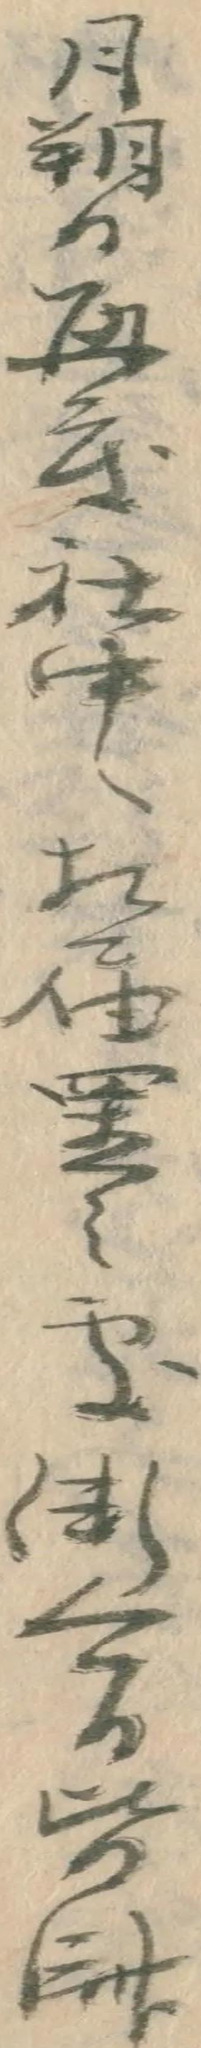月朔日再度社中へ相届置之處漸今日皆済
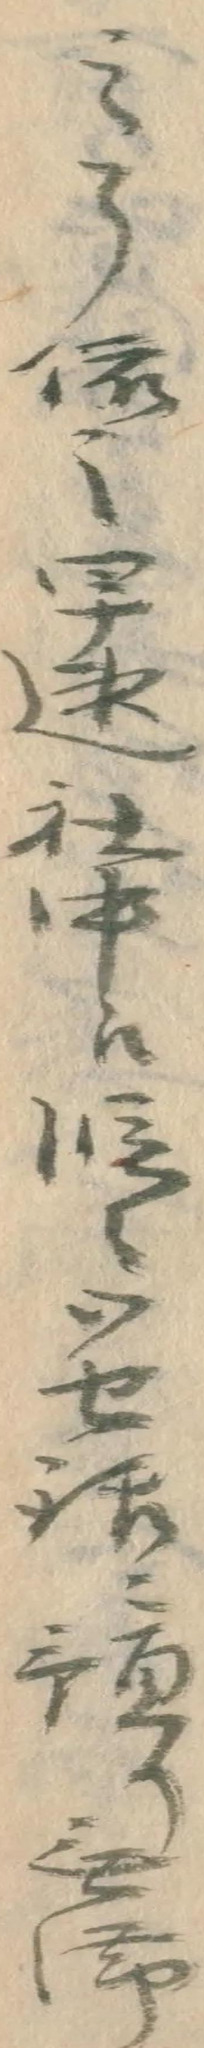之了依之早速社中江段〻御世話ニ預リ無滞

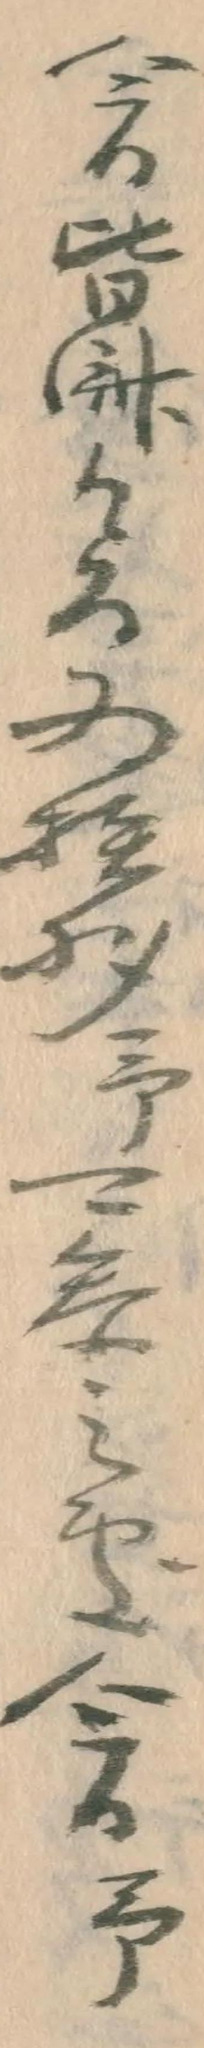今日皆済候旨為挨拶予可参之處今日予
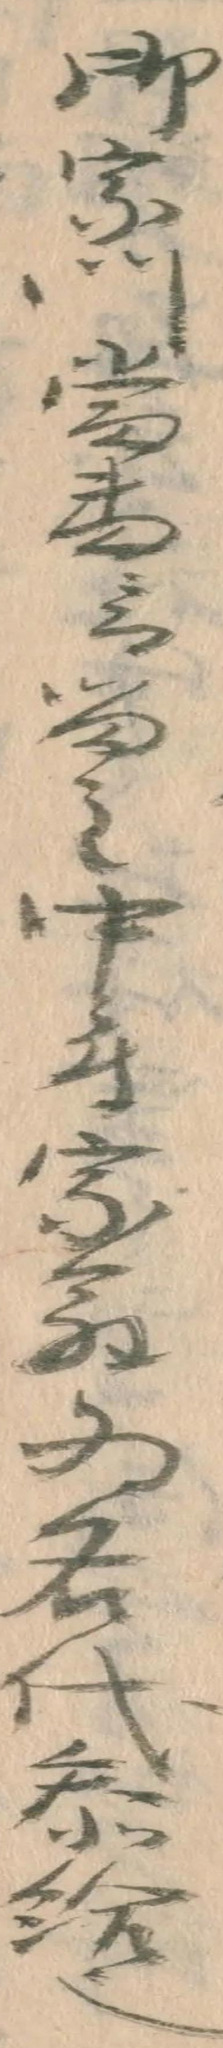御家門當番ニ而留之中ニ付家翁為名代参給也
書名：賀茂社記録. 第63冊
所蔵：国立国会図書館 National Diet Library, JAPAN
